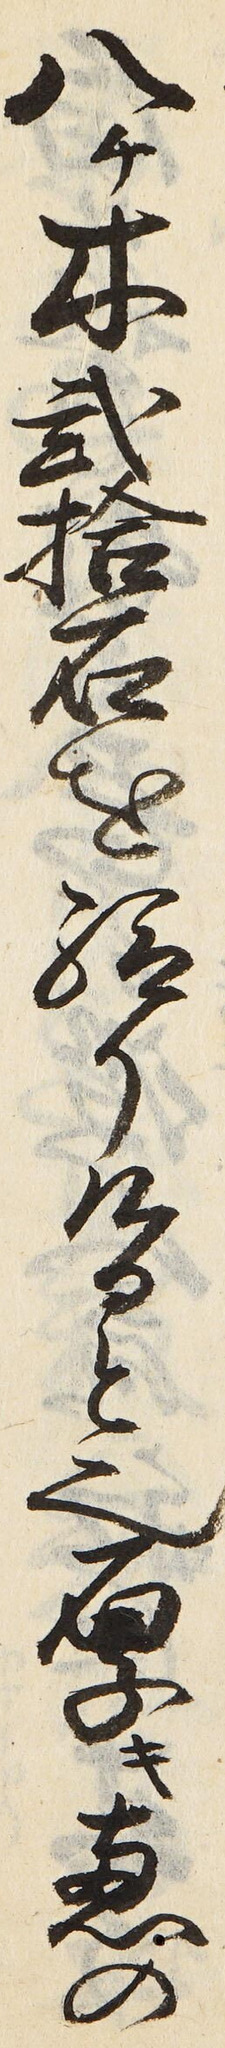八ケ木弐拾石を給りけると也厚き恵の
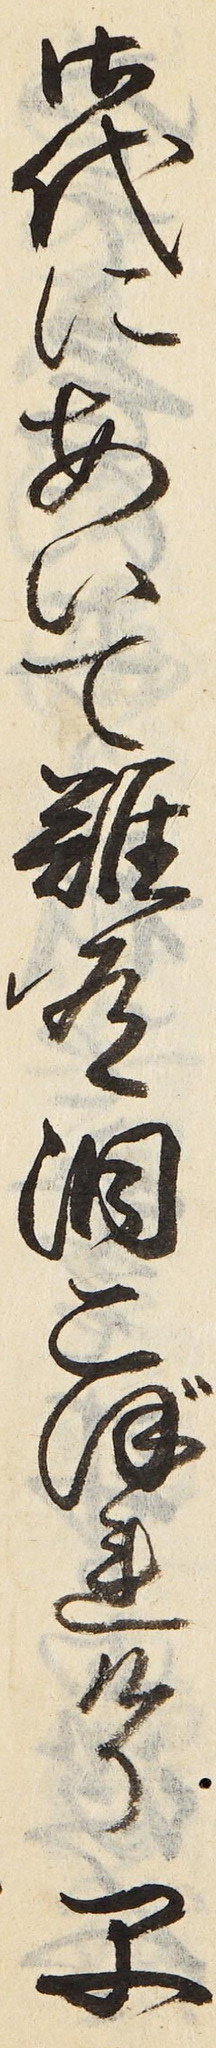御代にあいて難有泪こぼれけり早
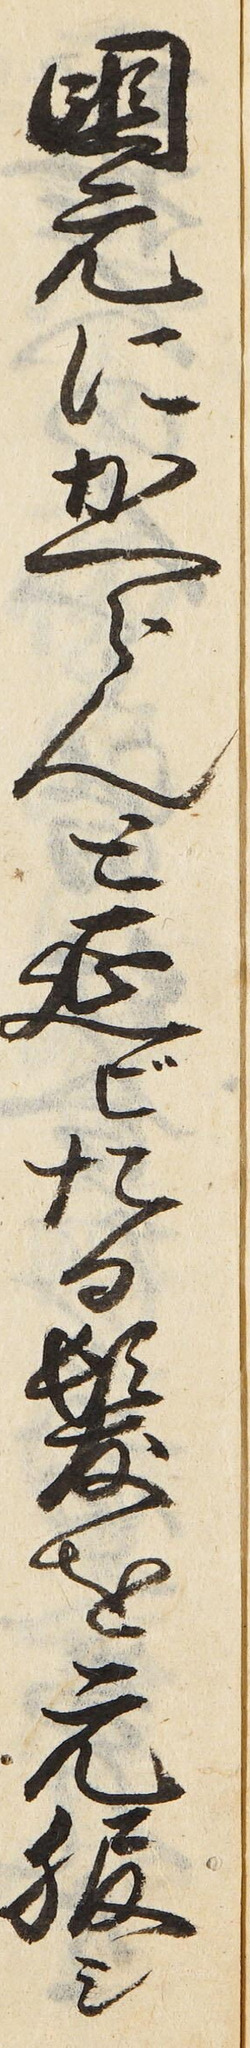国元にかへらんと延びたる髪を元服し
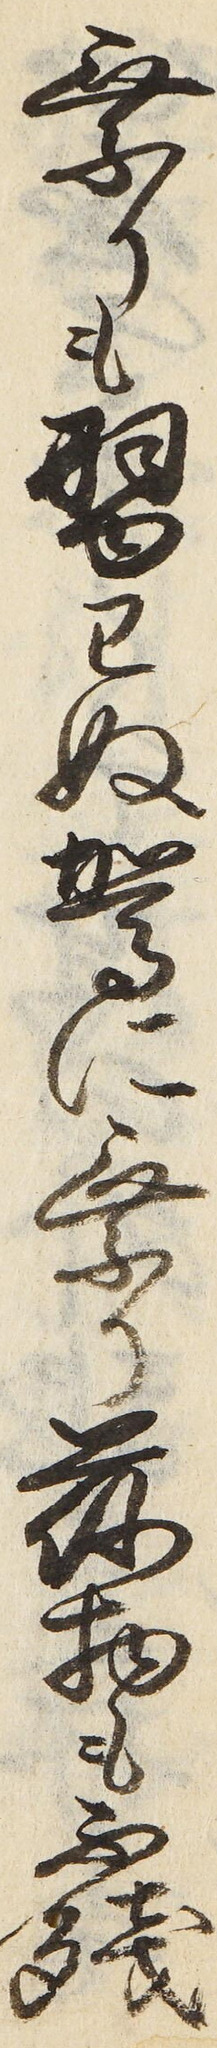乗りも習わぬ駕に乗り荷物も不残
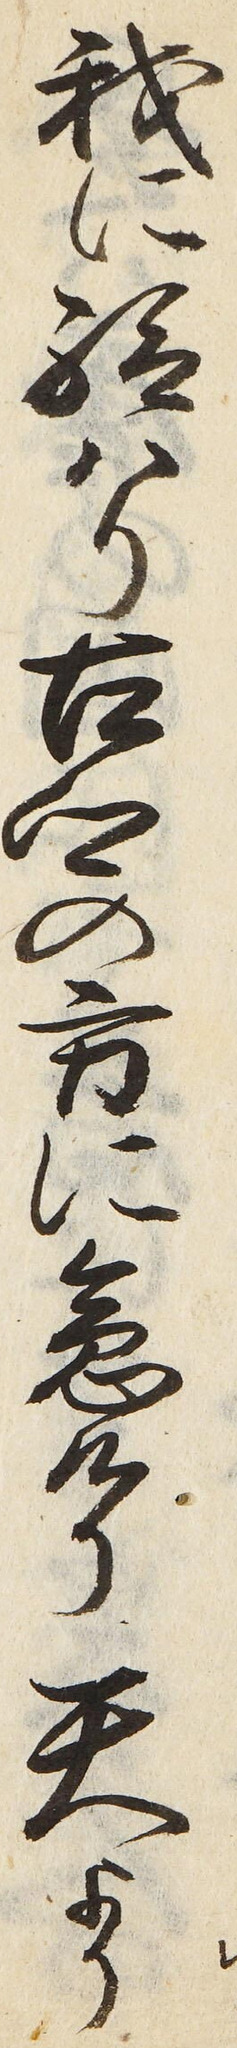我に給はり古郷の方に急けり天より
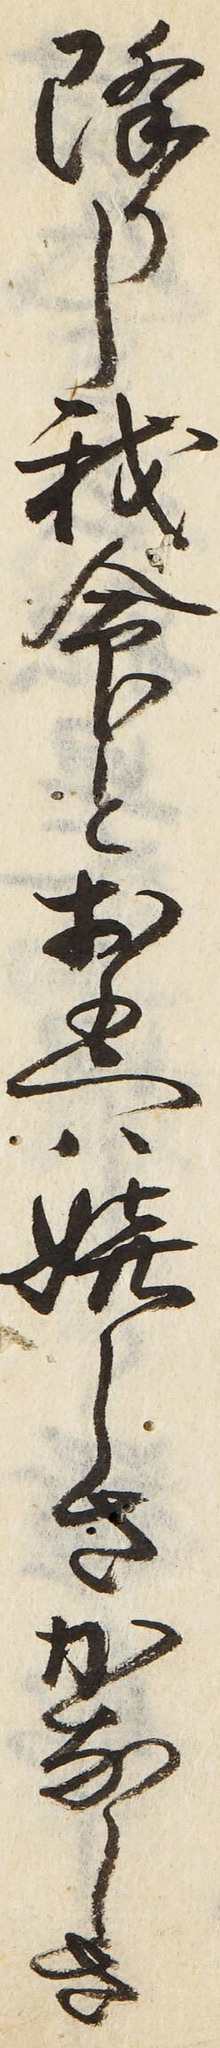降りし我命とおもへは嬉しさかなしさ
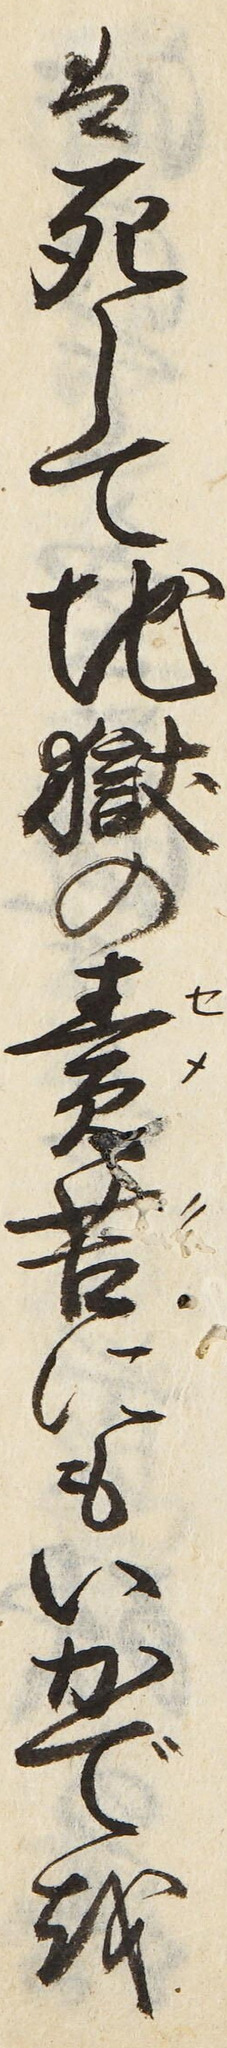は死して地獄の責苦にもいかでを
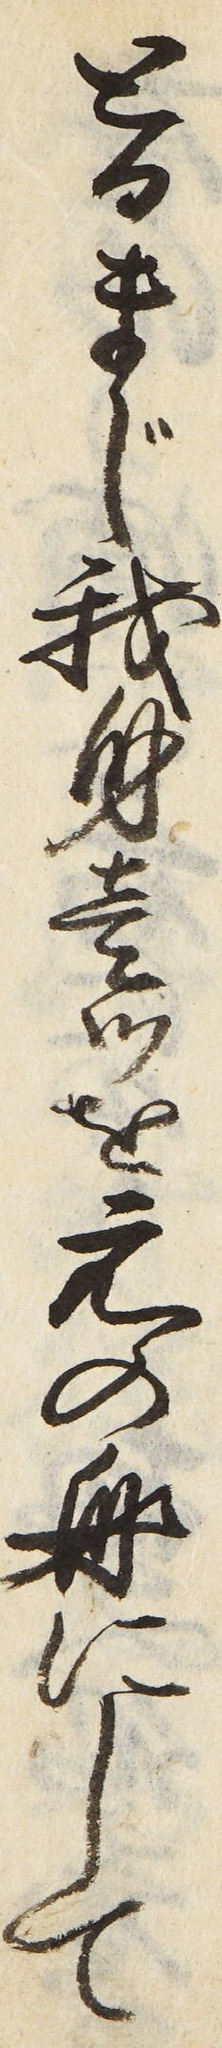とるまじ我身壱ツを元の身にして
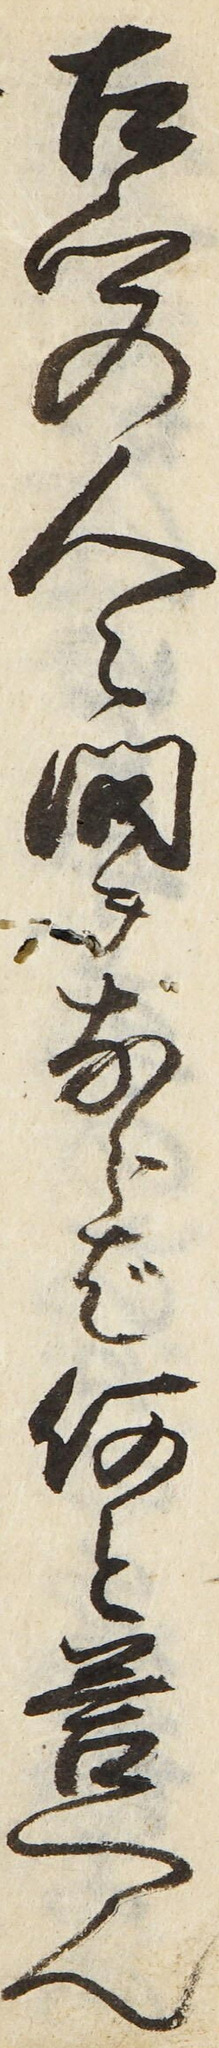古郷の人々問をならば何と答へん
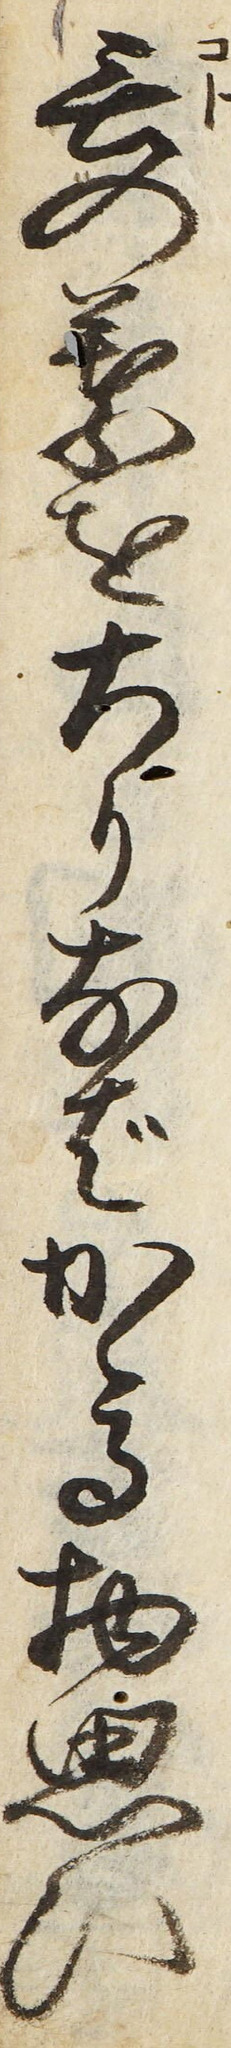云の葉をちりなばかゝる物思ひ

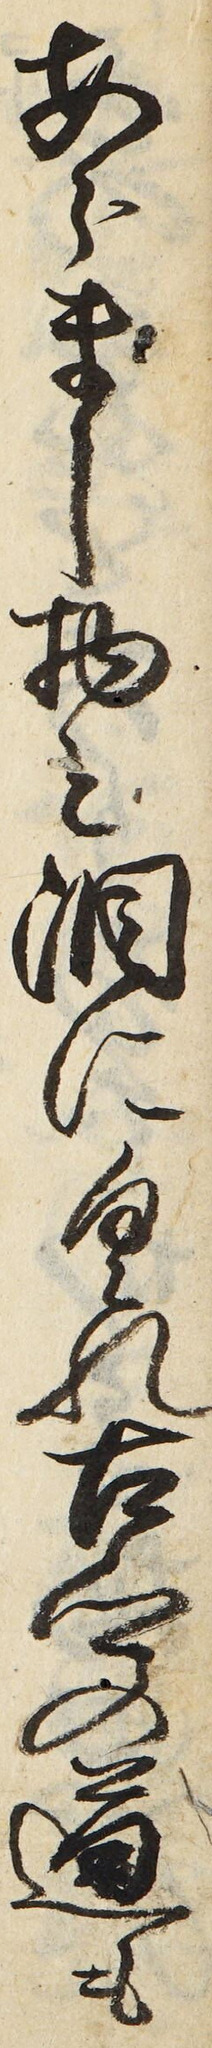あらまし物と泪にくれ古郷の道も
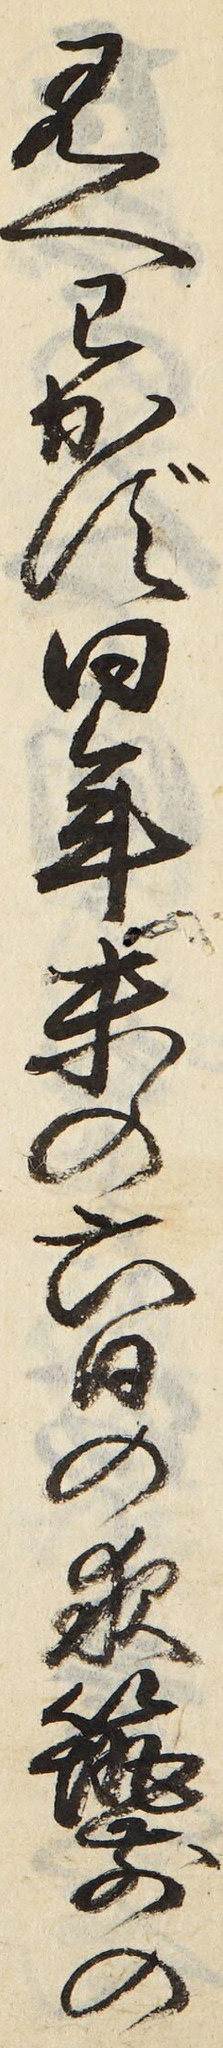見へわかず同年来の六日の夜筑前の
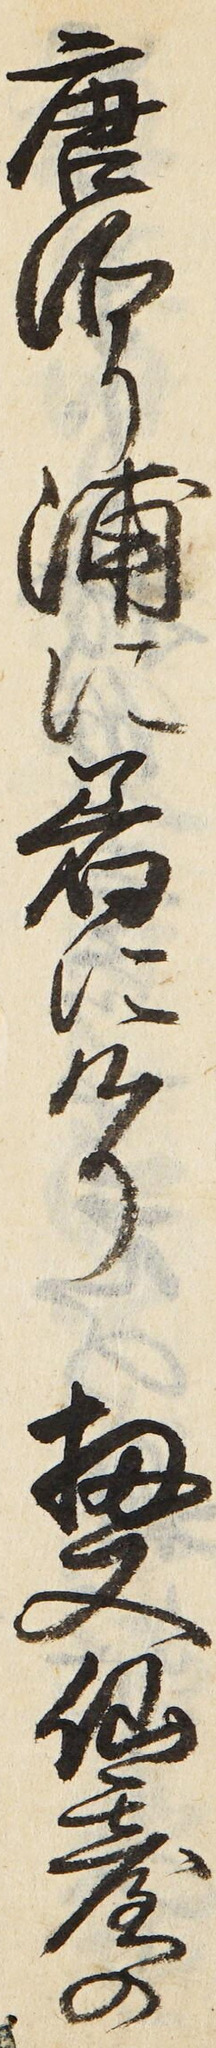唐泊り浦に着にけり扨又仙台の
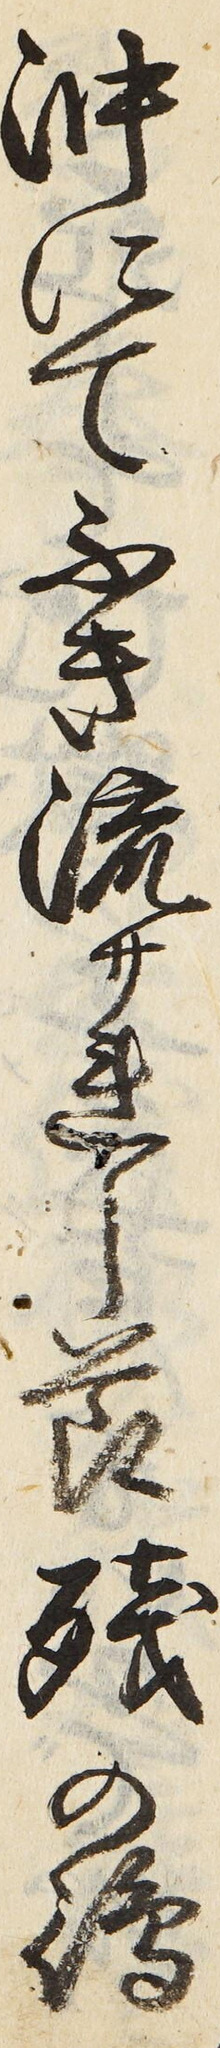沖にてふき流されし節残の嶋
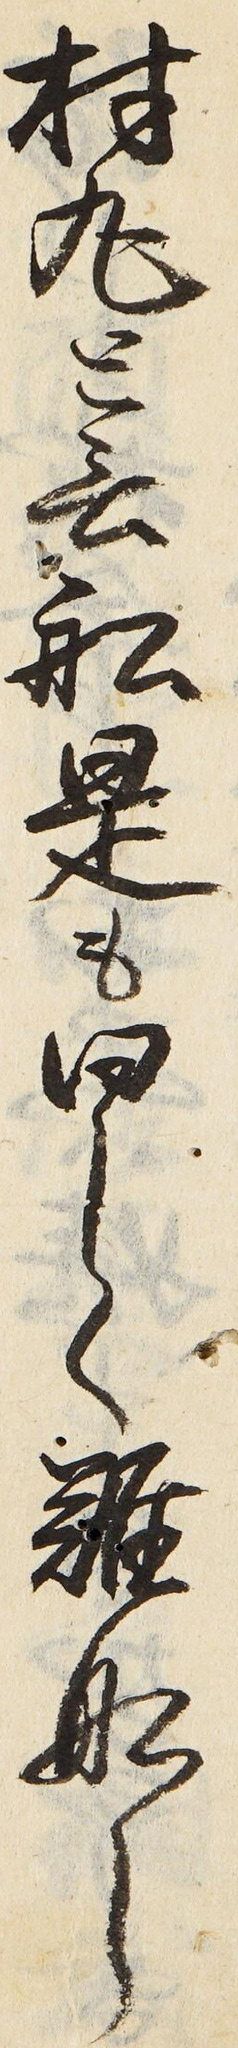村丸と云船是も同しく難船し
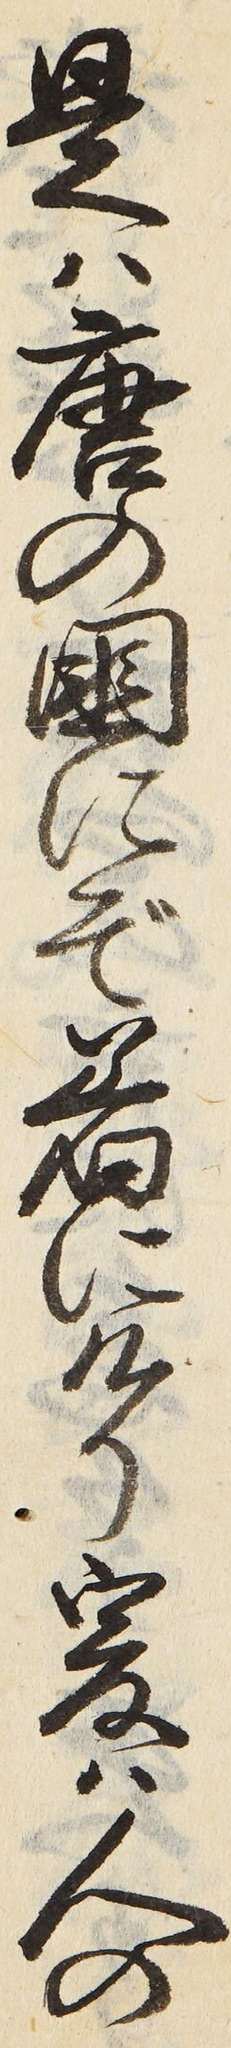是は唐の国にぞ着にけり爰は人の
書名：華夷九年録
